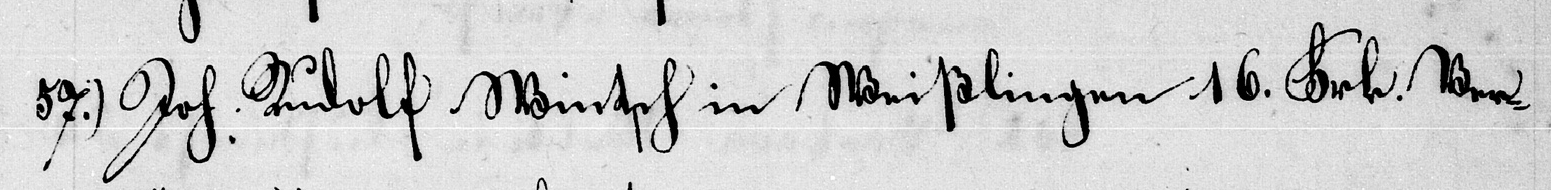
57.) Joh. Rudolf Wintsch in Weißlingen 16. Frk. Ver¬
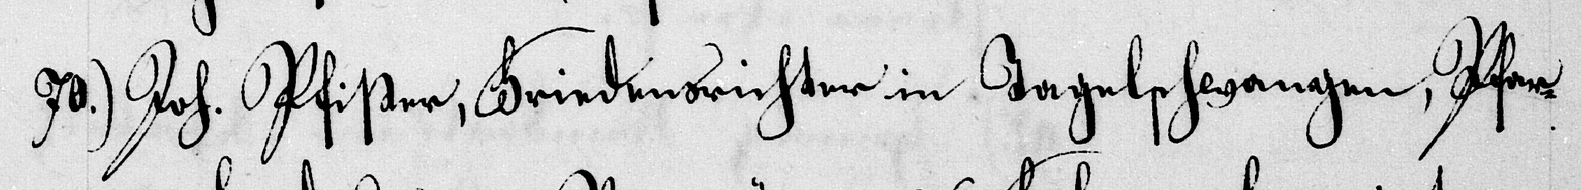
70.) Joh. Pfister, Friedensrichter in Tagelschwangen, Pfar¬
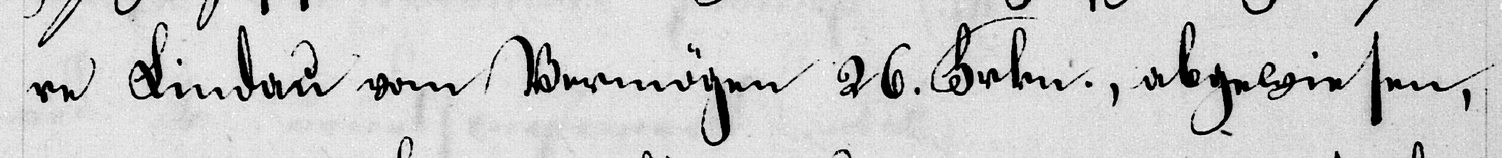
re Lindau vom Vermögen 26. Frkn., abgewiesen,
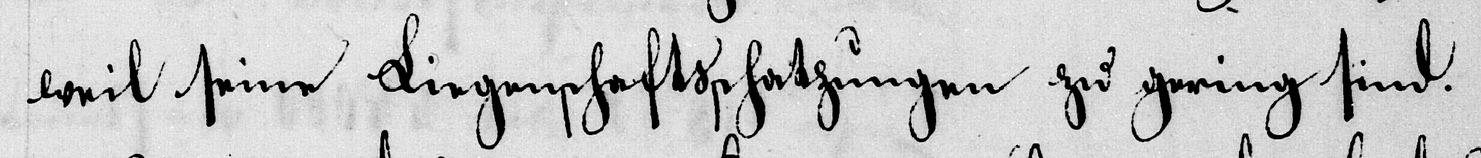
weil seine Liegenschaftsschatzungen zu gering sind.
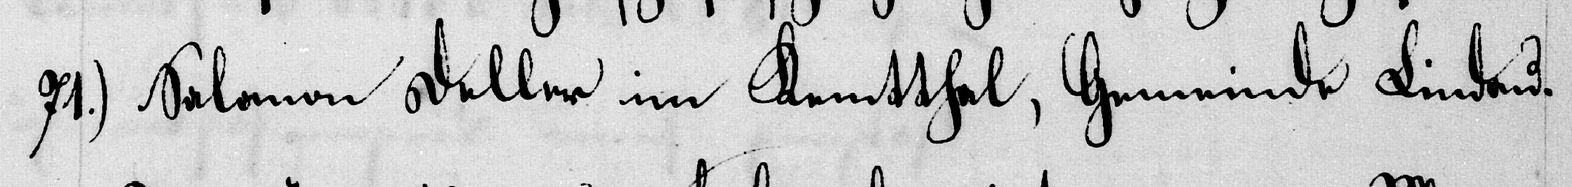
71.) Salomon Deller im Kemtthal, Gemeinde Lindau.
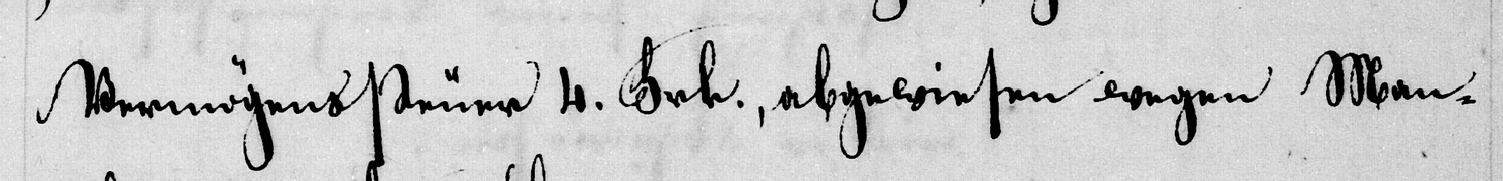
Vermögenssteuer 4. Frk., abgewiesen wegen Man¬
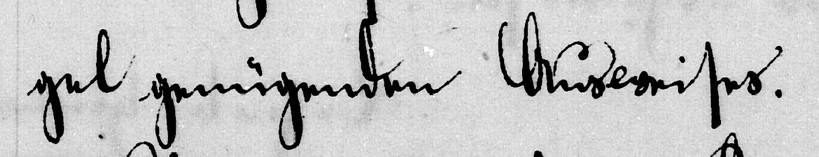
gel genügenden Ausweises.
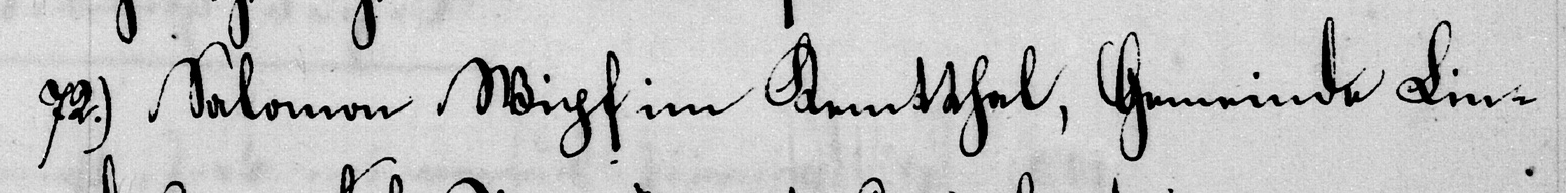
72.) Salomon Wipf im Kemtthal, Gemeinde Lin¬
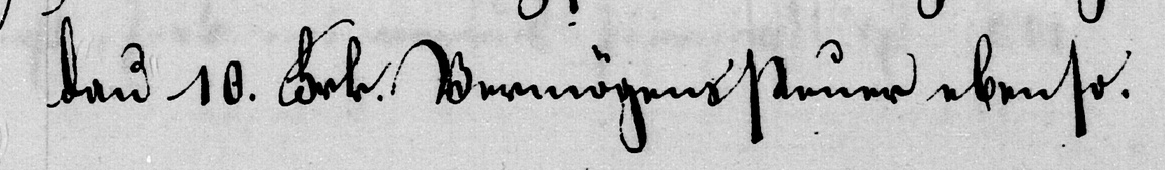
dau 10. Frk. Vermögenssteuer ebenso.
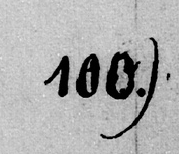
110.)
